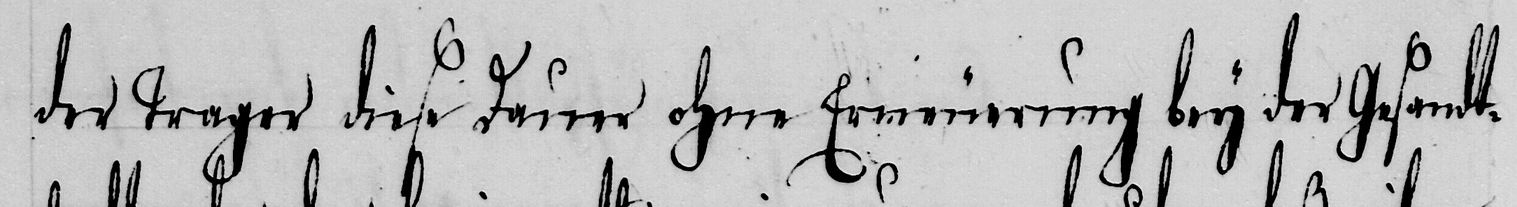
der Trager diese Dauer ohne Erneuerung bey der Gesand¬
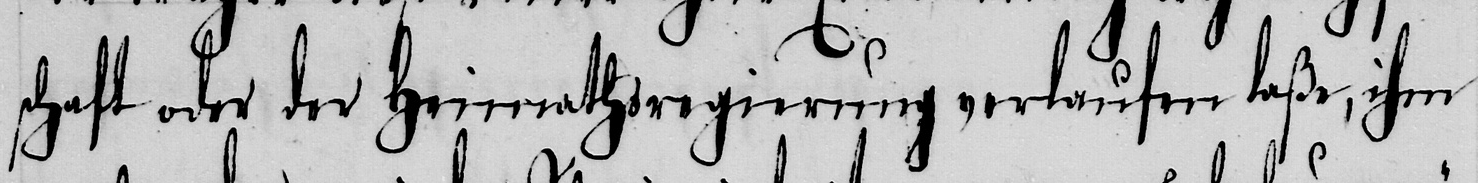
schaft oder der Heimathsregierung verlaufen laße, ihm
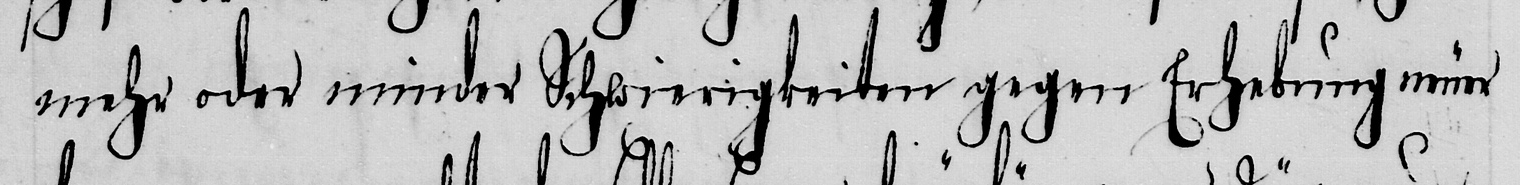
mehr oder minder Schwierigkeiten gegen Erhebung neuer
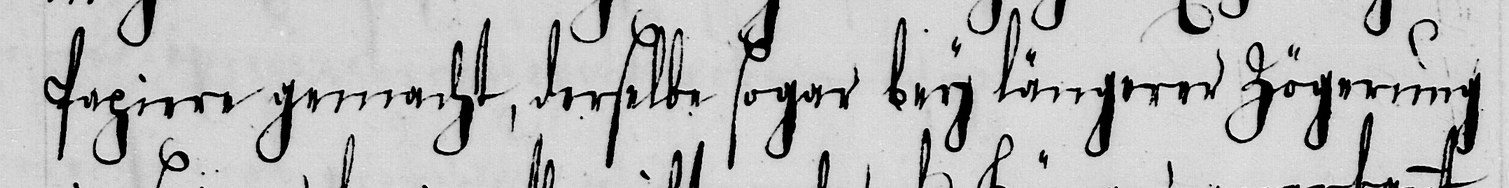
Papiere gemacht, derselbe sogar bey längerer Zögerung
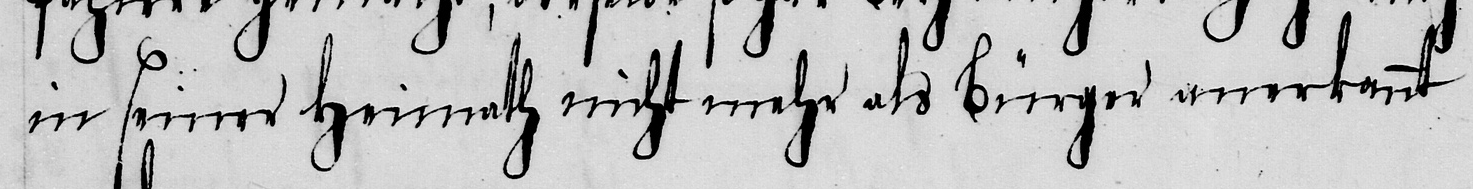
in seiner Heimath nicht mehr als Bürger anerkannt
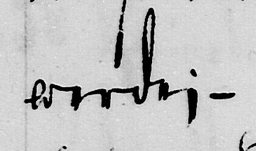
werde; –
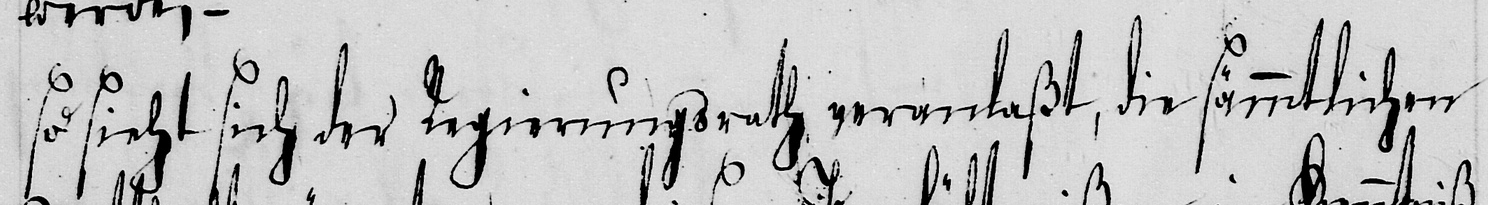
sieht sich der Regierungsrath veranlaßt, die sämmtlichen
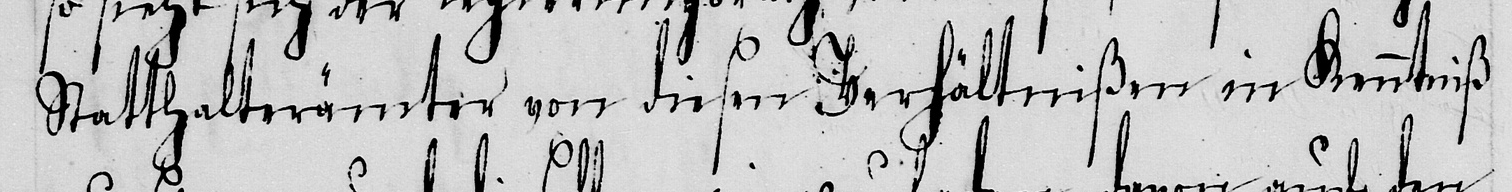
Statthalterämter von diesen Verhältnißen in Kenntniß
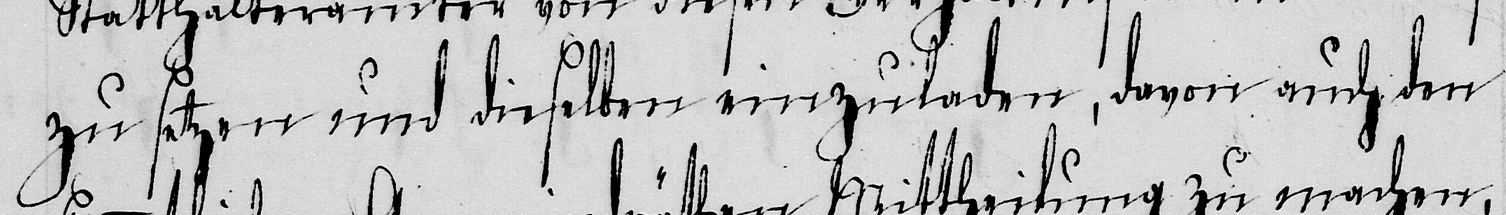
zu setzen und dieselben einzuladen, davon auch den
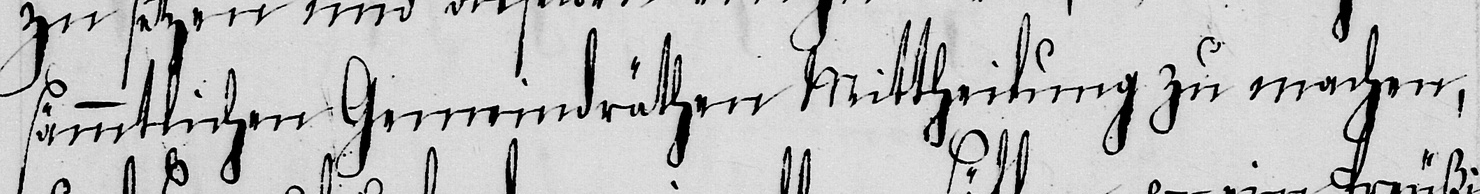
sämmtlichen Gemeindräthen Mittheilung zu machen,
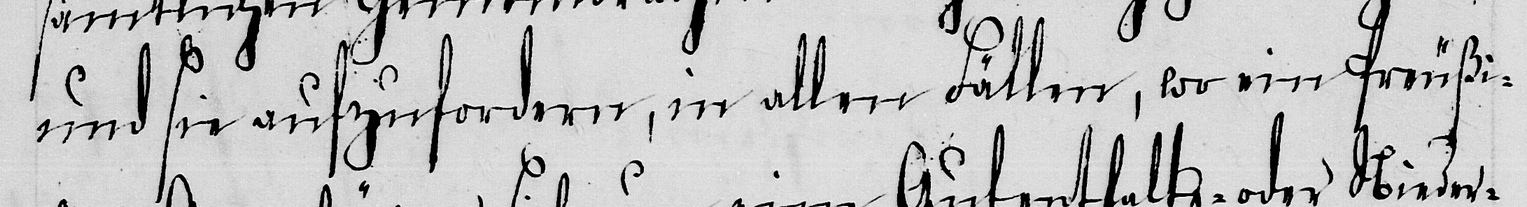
und sie aufzufordern, in allen Fällen, wo ein Preußi¬
